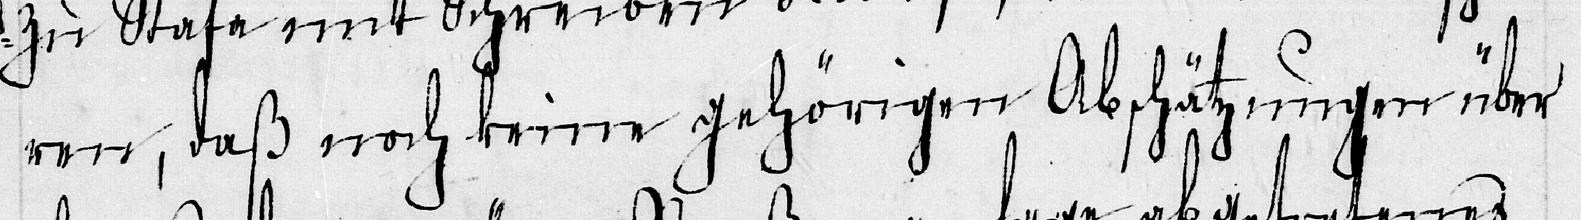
ren, daß noch keine gehörigen Abschätzungen über
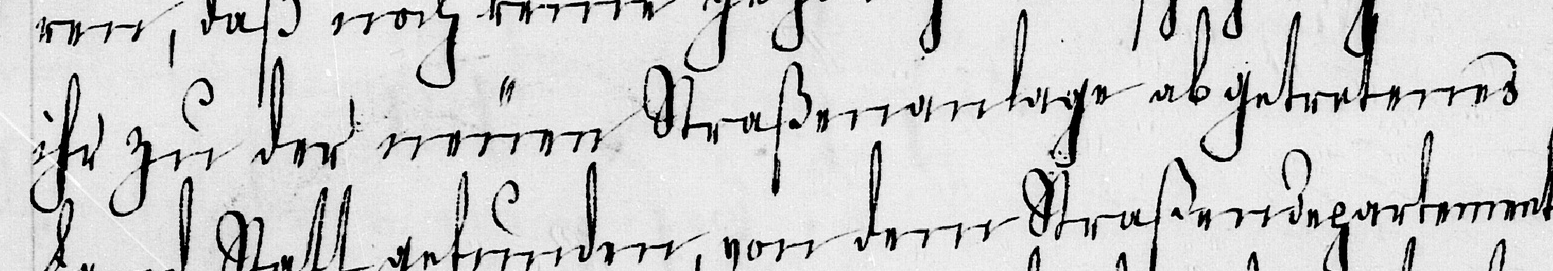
ihr zu der neuen Straßenanlage abgetretenes
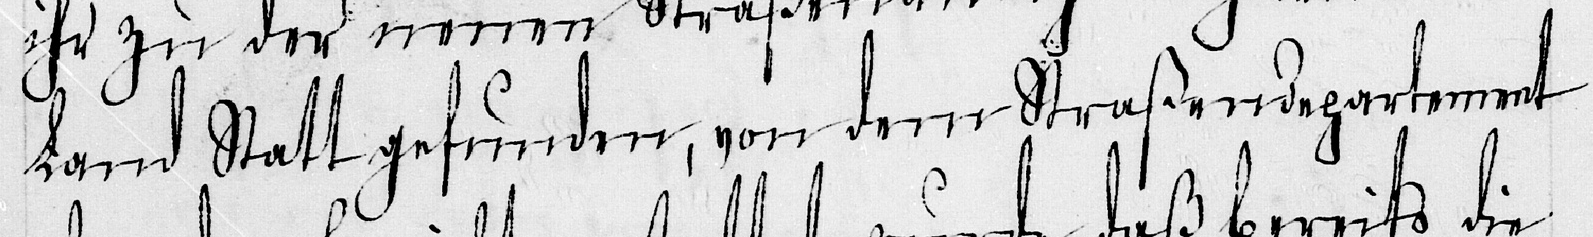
Land Statt gefunden, von dem Straßendepartement
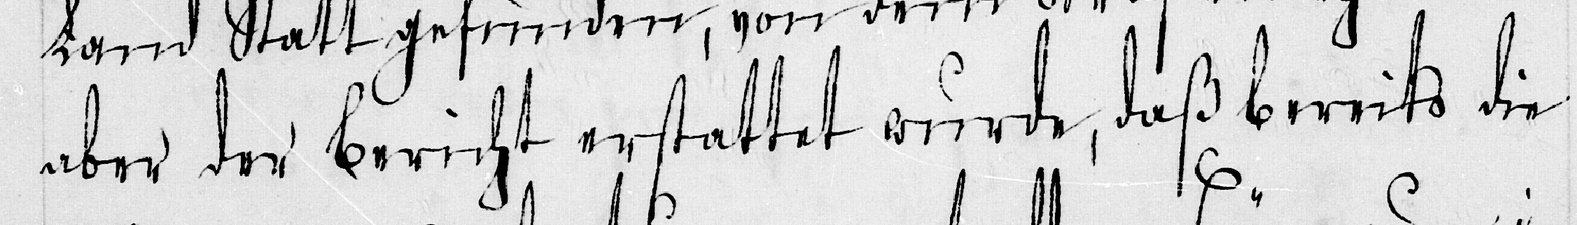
aber der Bericht erstattet wurde, daß bereits die
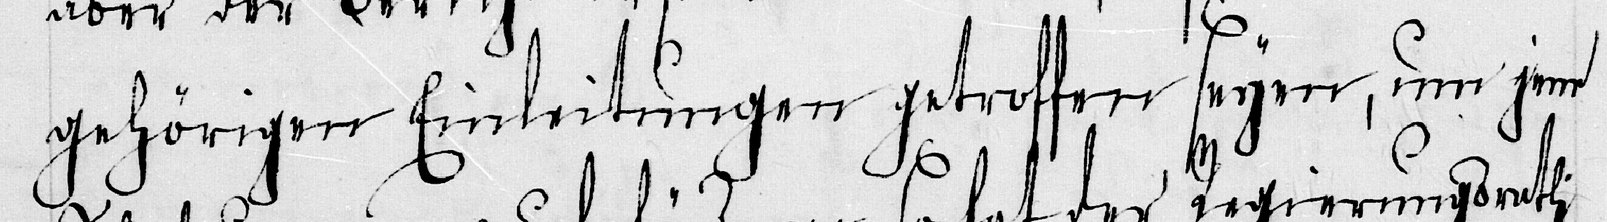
gehörigen Einleitungen getroffen seyen, um jene
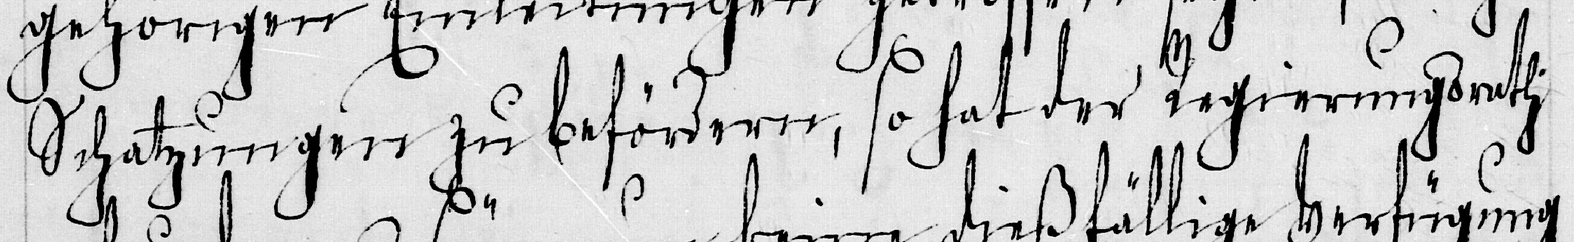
Schatzungen zu befördern, so hat der Regierungsrath
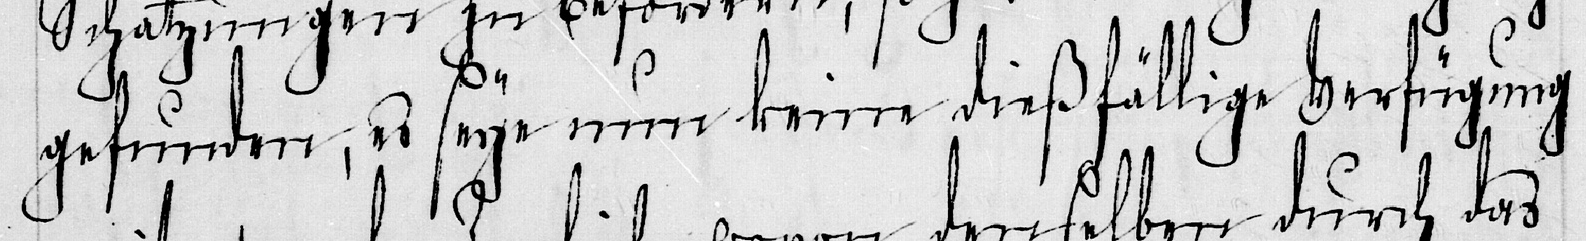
gefunden, es seye nun keine dießfällige Verfügung
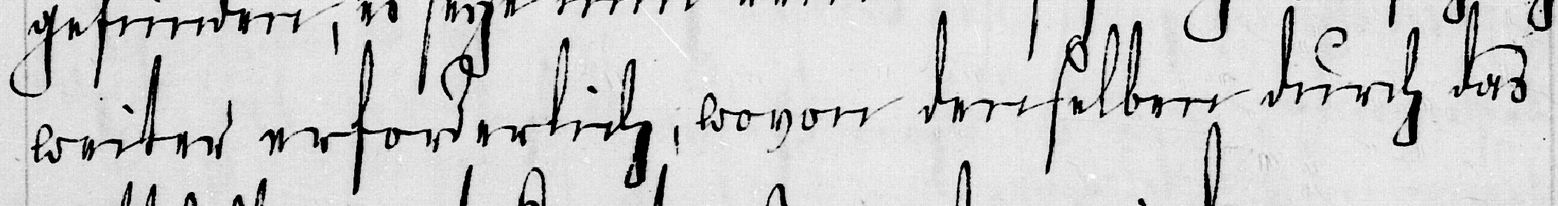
weiter erforderlich, wovon denselben durch das
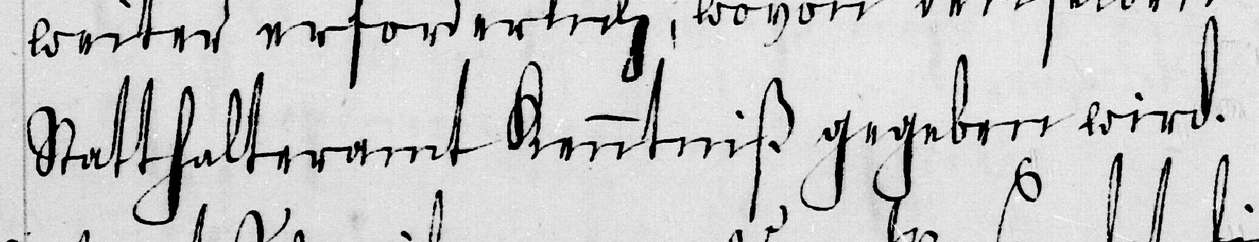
Statthalteramt Kenntniß gegeben wird.
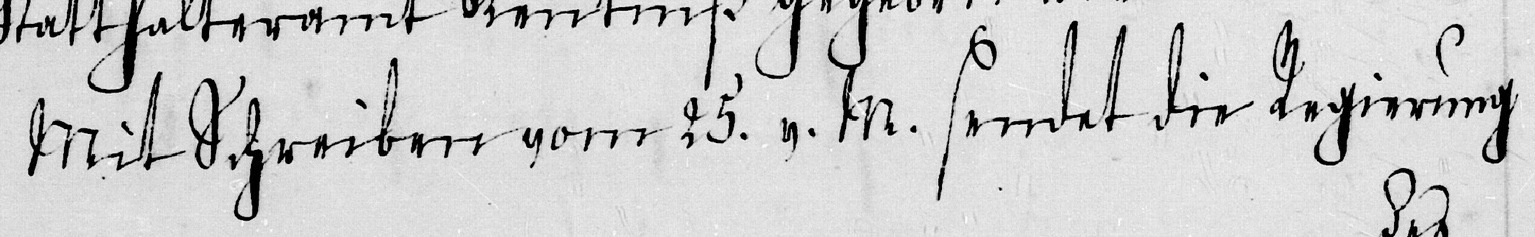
Mit Schreiben vom 25. d. M. sendet die Regierung
